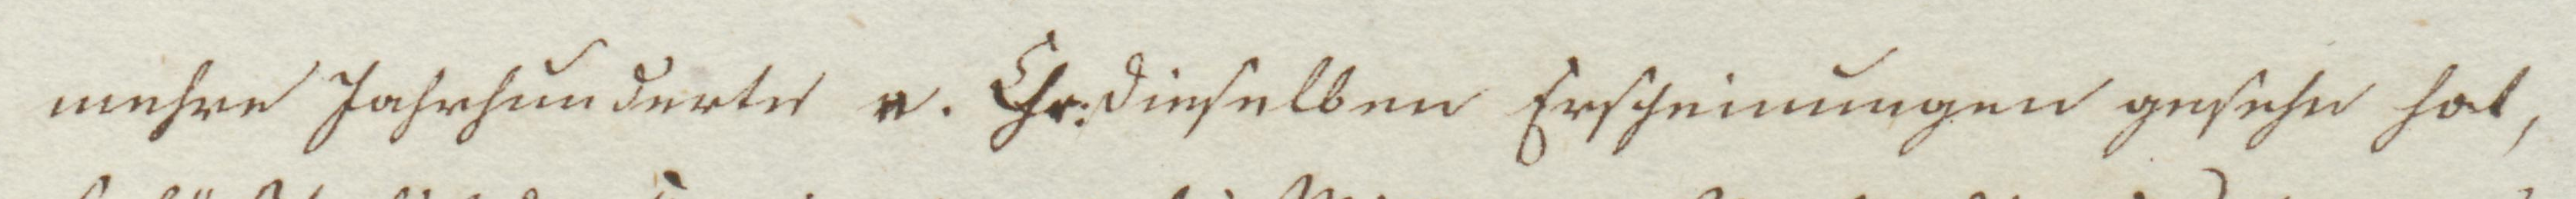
mehre Jahrhunderte n. Chr: dieselben Erscheinungen gesehn hat,
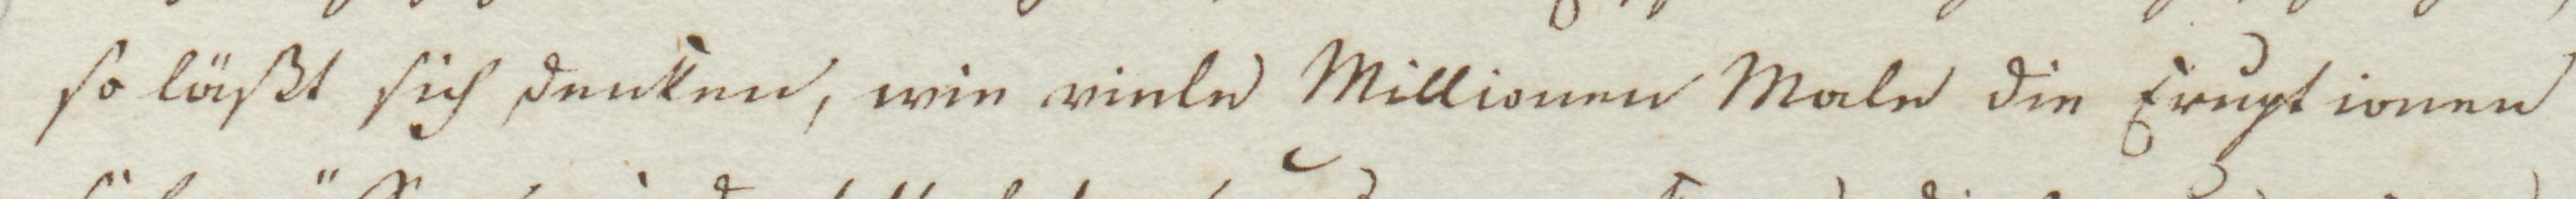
so läßt sich denken, wie viele Millionen Male die Eruptionen
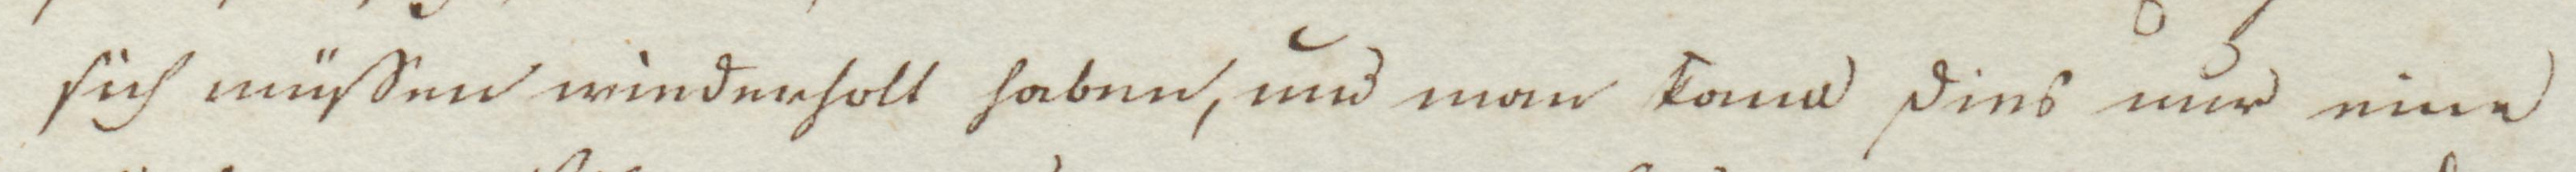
sich müssen wiederholt haben, und man kann dies nur eine
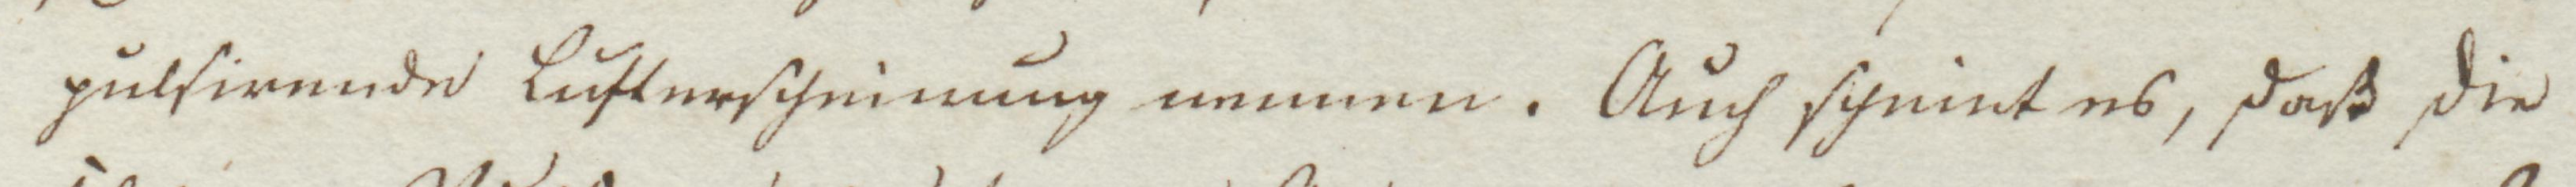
pulsirende Lufterscheinung nennen. Auch scheint es, daß die
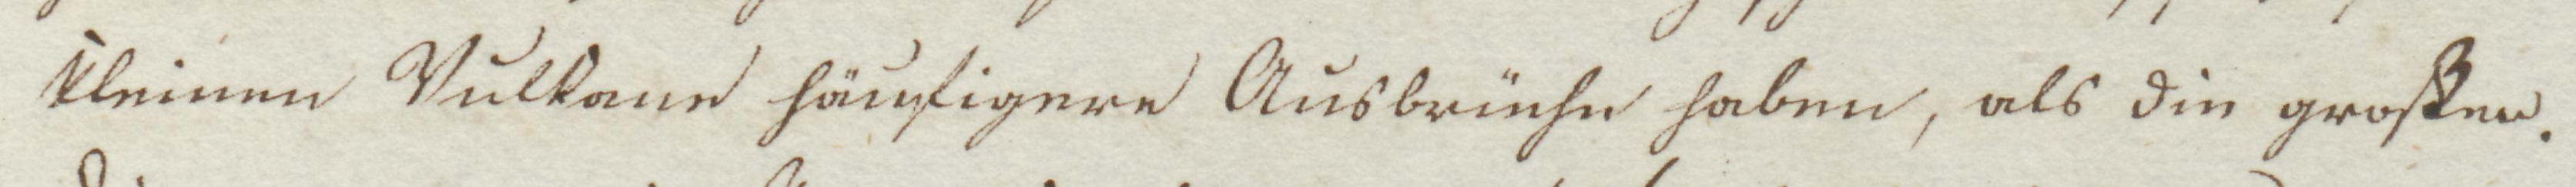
kleinen Vulkane häufigere Ausbrüche haben, als die großen.
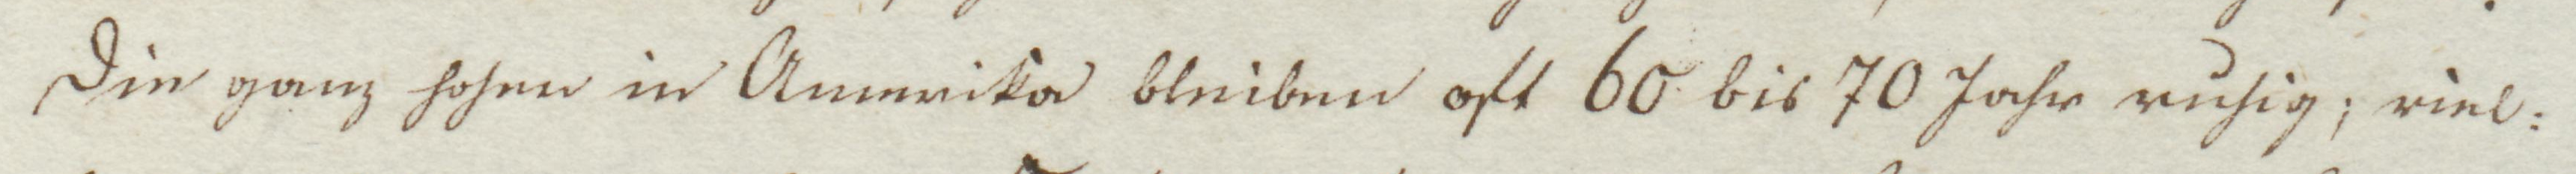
Die ganz hohen in Amerika bleiben oft 60 bis 70 Jahre ruhig; viel-
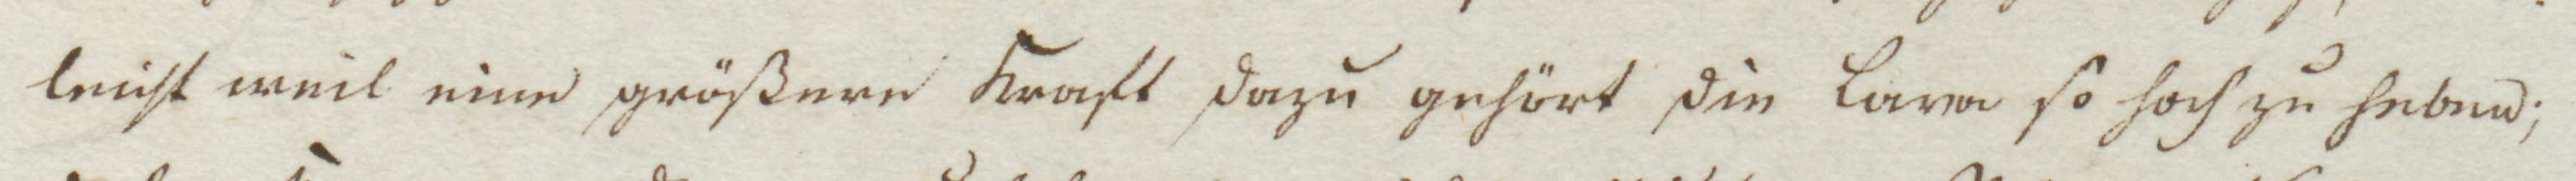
leicht weil eine größere Kraft dazu gehört die Lava so hoch zu heben;
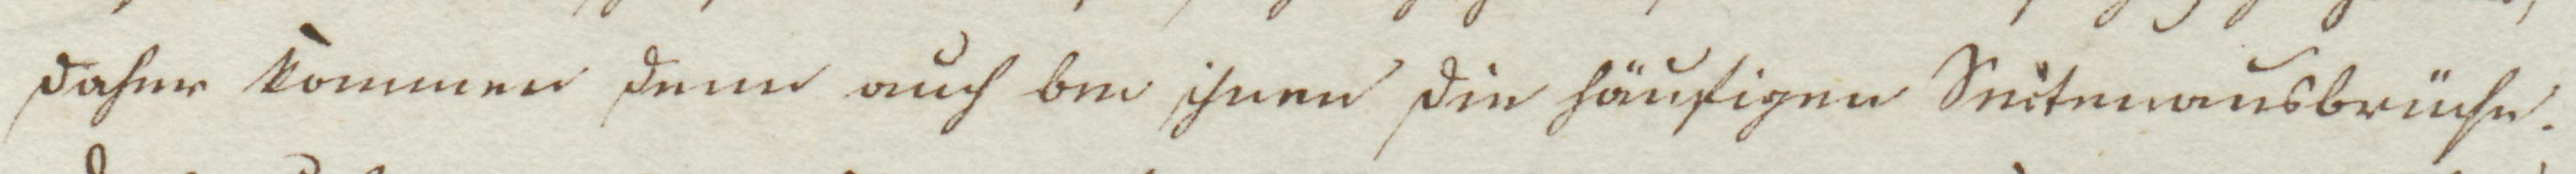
daher kommen denn auch bei ihnen die häufigen Seitenausbrüche.
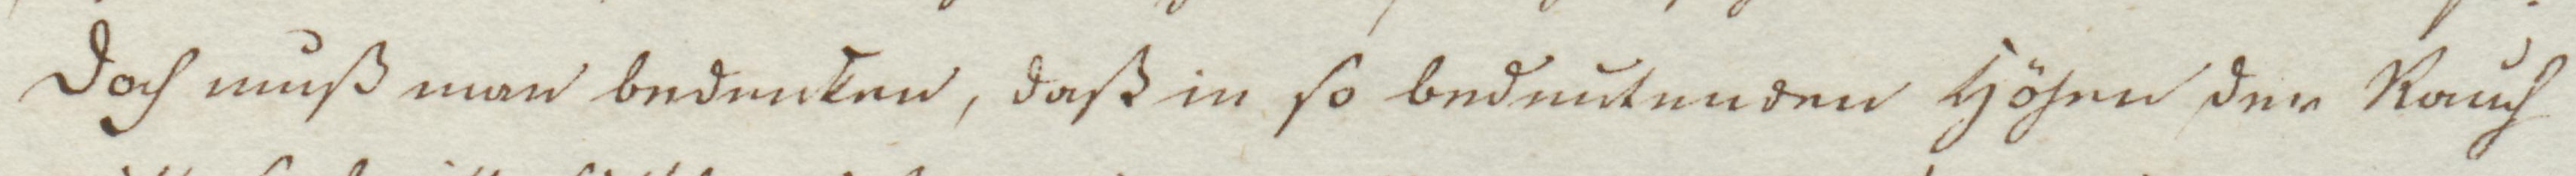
Doch muß man bedenken, daß in so bedeutenden Höhen der Rauch
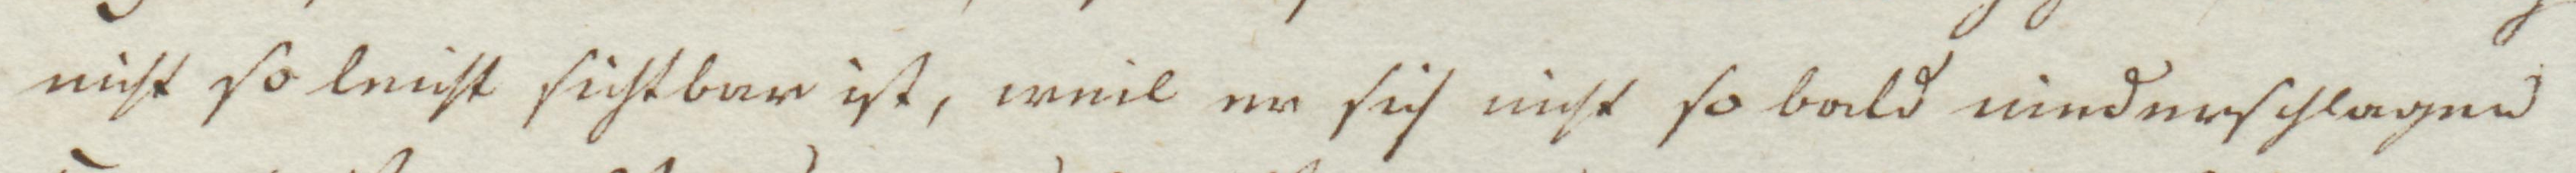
nicht so leicht sichtbar ist, weil er sich nicht so bald niederschlagen
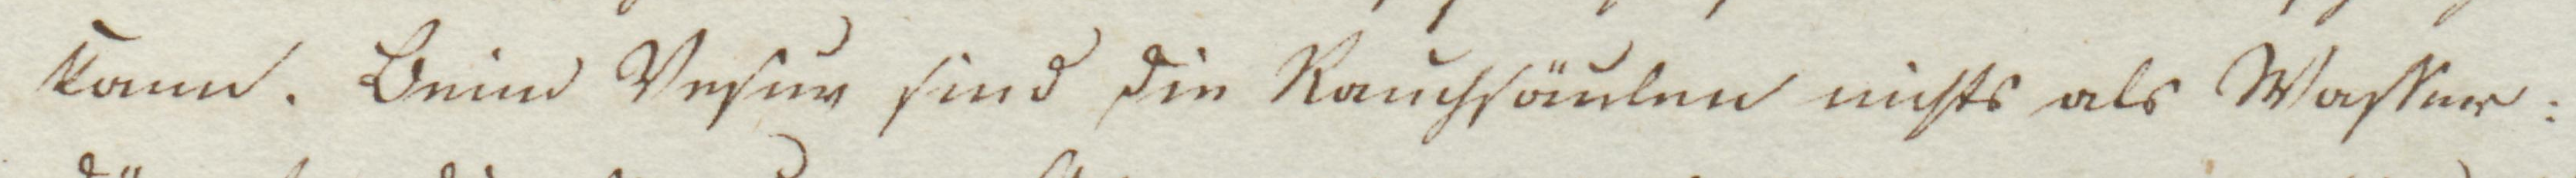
kann. Beim Vesuv sind die Rauchsäulen nichts als Wasser-
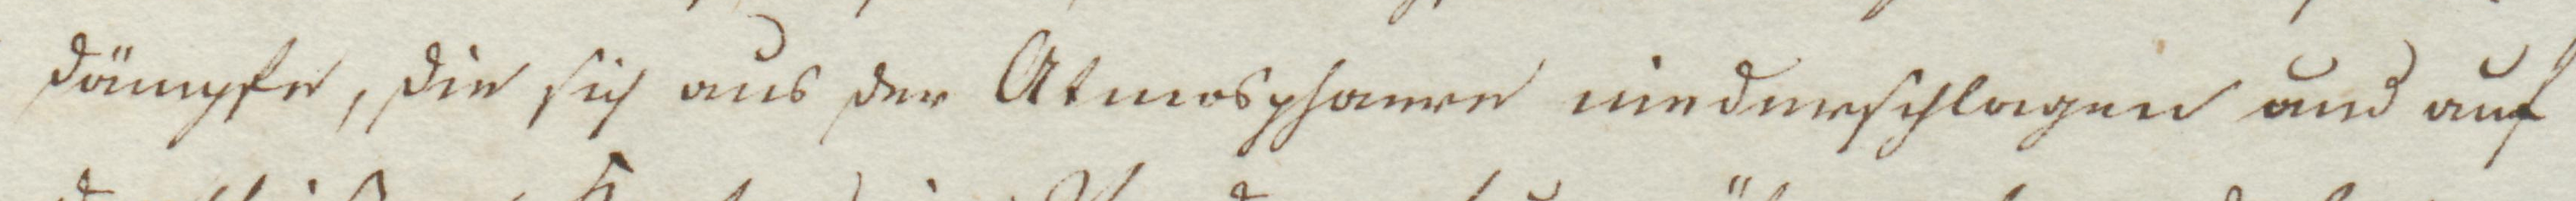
dämpfe, die sich aus der Atmosphaere niederschlagen und auf
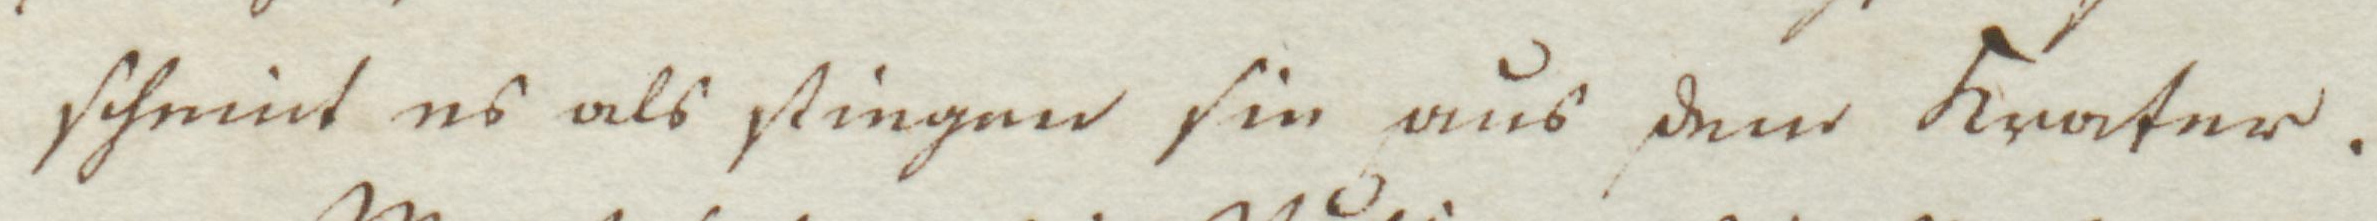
scheint es als stiegen sie aus dem Krater.
